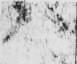八
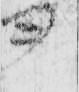月
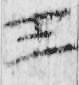壬
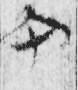午
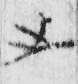之
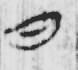日
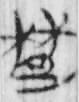楚
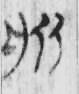斨
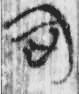司
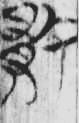敗
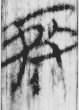攸
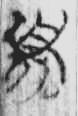須
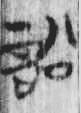訟
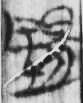○（陽）
